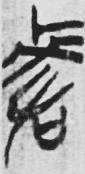差（嗟）
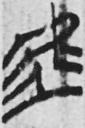○（吾）
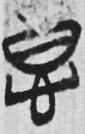憙（喜）
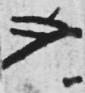之
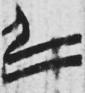○（鳲）
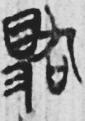○（鳩）
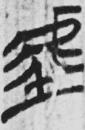○（吾）
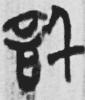○（信）
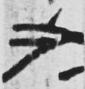之
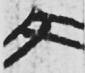文
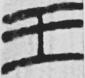王
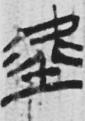○（吾）
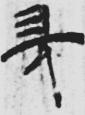𡵂（美）
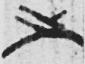之
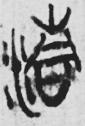清
